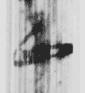㠯（以）
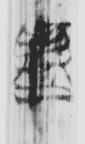{與口止}
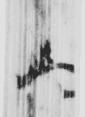之
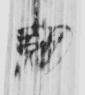則
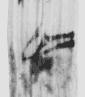亡
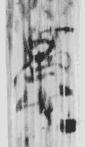{肙心}
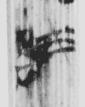唯
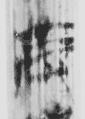皮
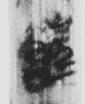灋
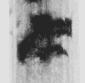民
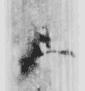之
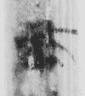不
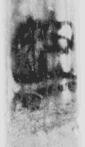{豚止}
